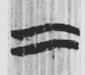二
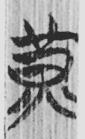黃
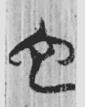它
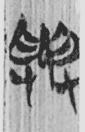與
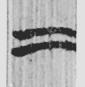二
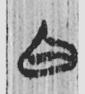白
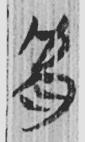兔
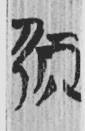凥
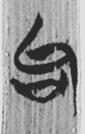句
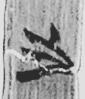之
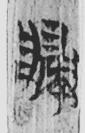{爿帚}（寢）
